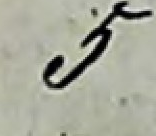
5
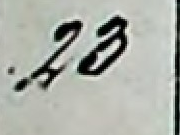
23
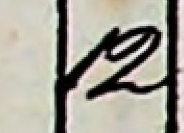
12
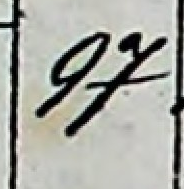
97
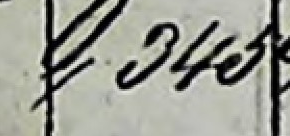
0,345
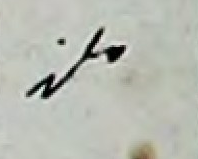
do
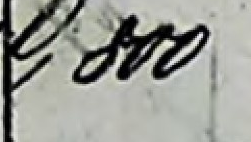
0,800
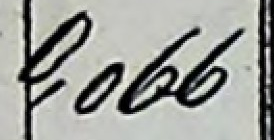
0,066
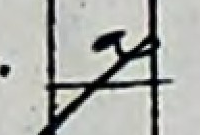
7
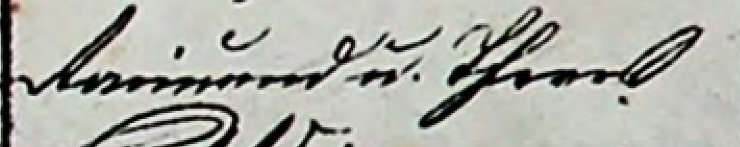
Daimund Theres
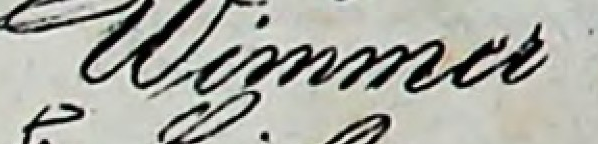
Wimmer
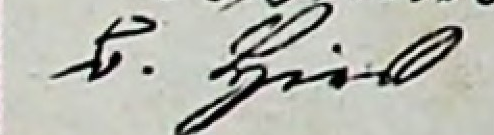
v. Hirs
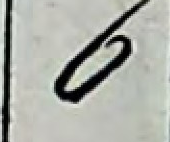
6
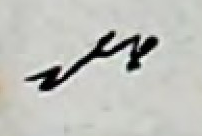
do
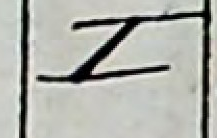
I
